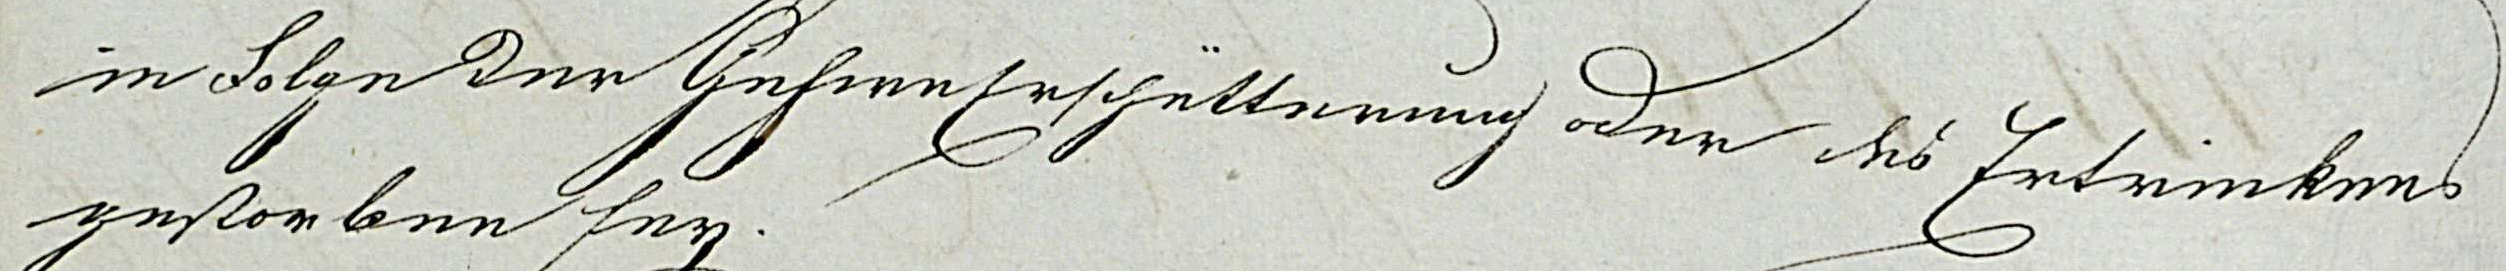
in Folge der Gehirnerschütterung oder das Ertrinkens
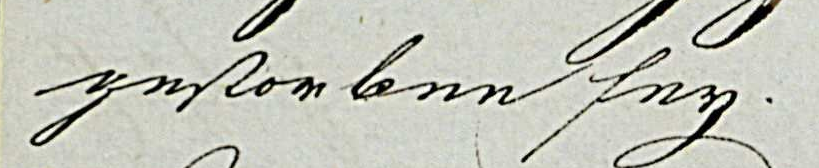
gestorben sey.
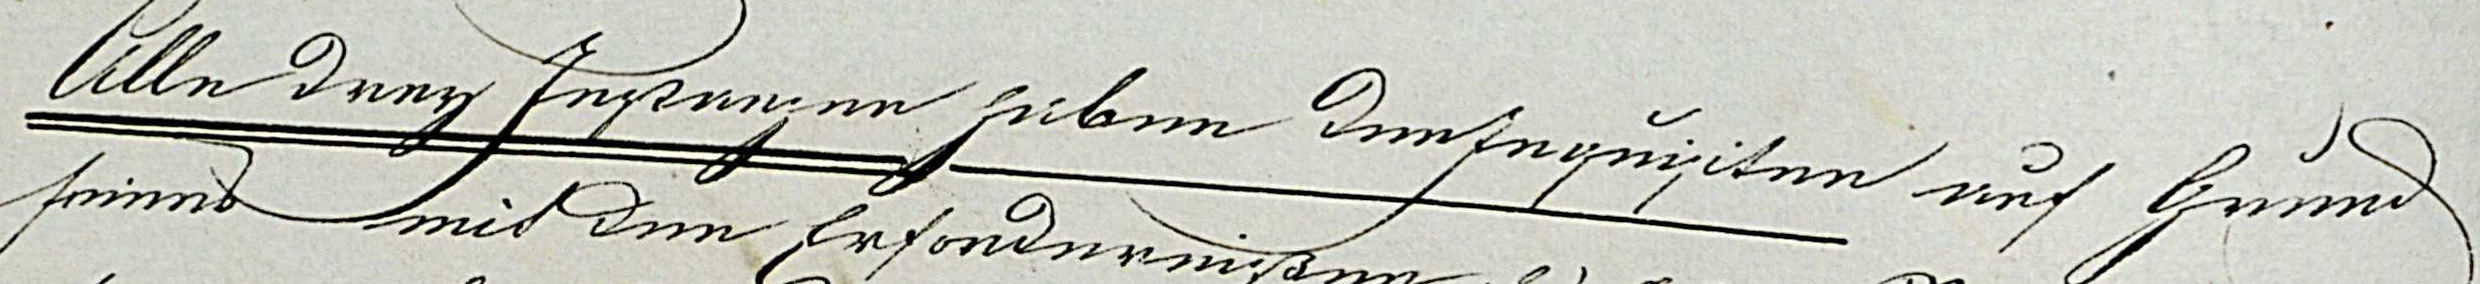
Alle drey Instanzen haben dem Inquisiten auf Grund
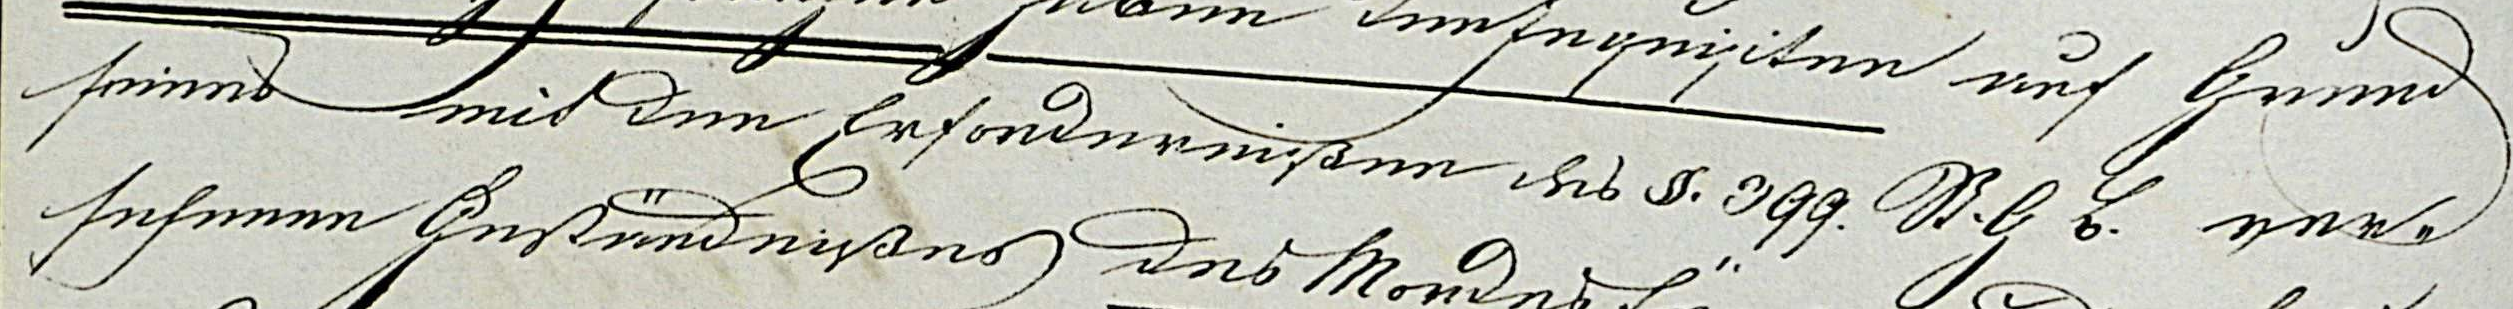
seines mit dem Erfordernißen des §399 St. G. B. ver¬
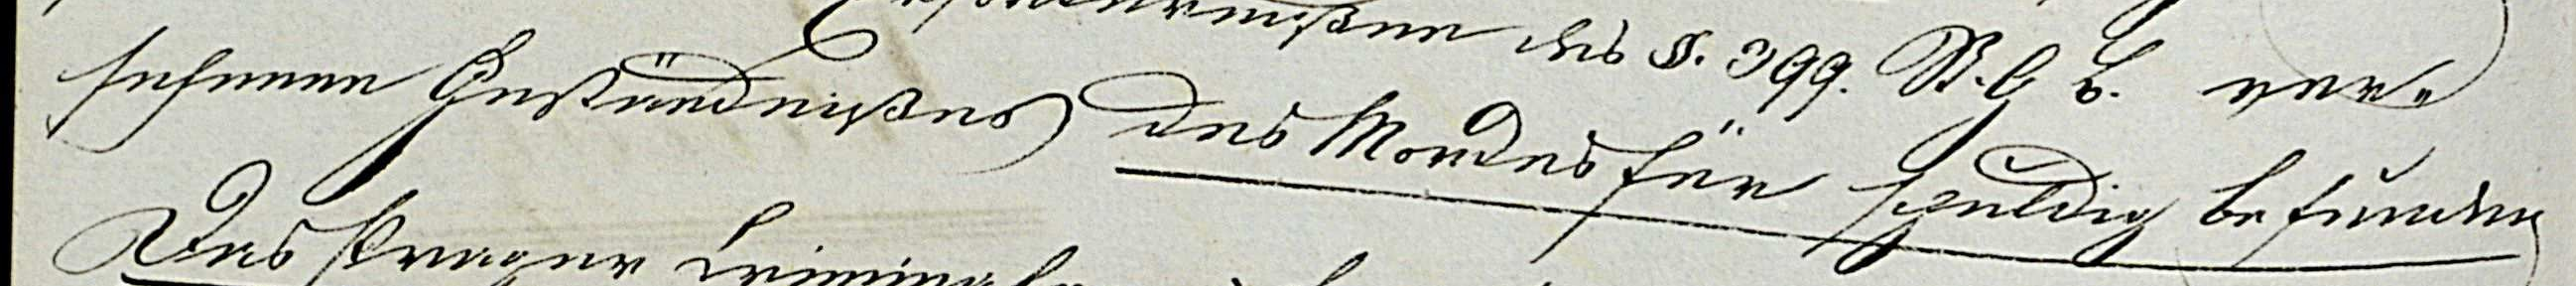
sehenen Geständnißes des Mordes für schuldig befunden.
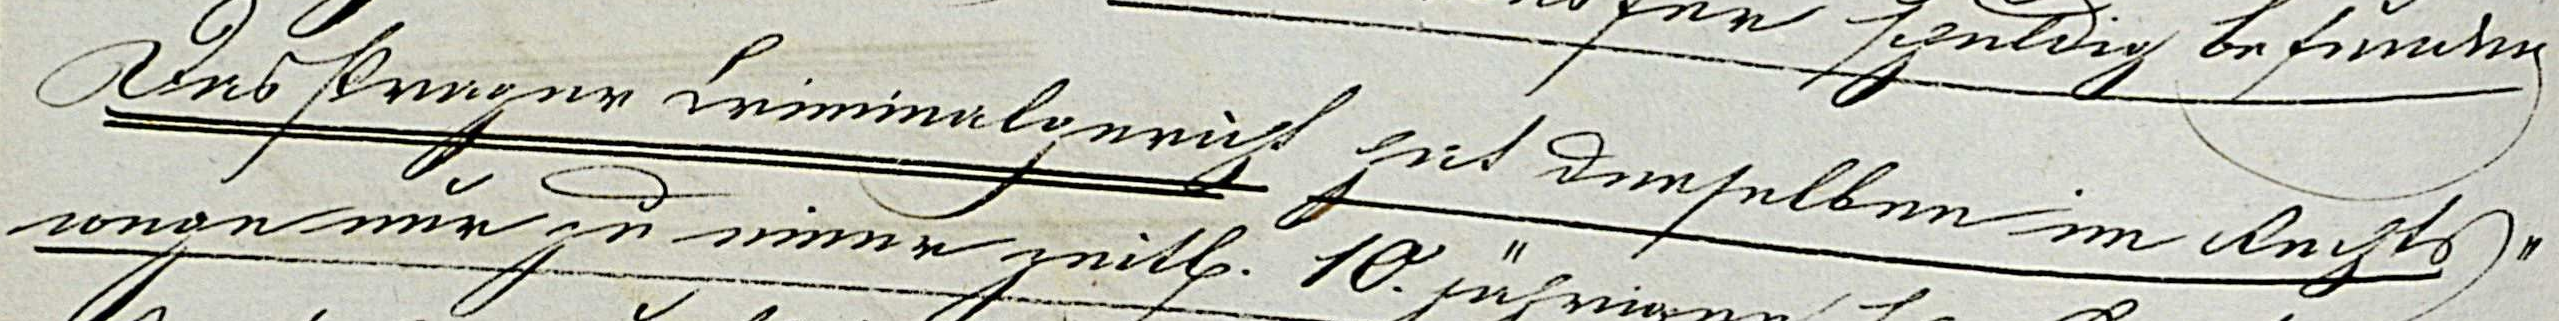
Das Prager Criminalgericht hat demselben im Rechts¬
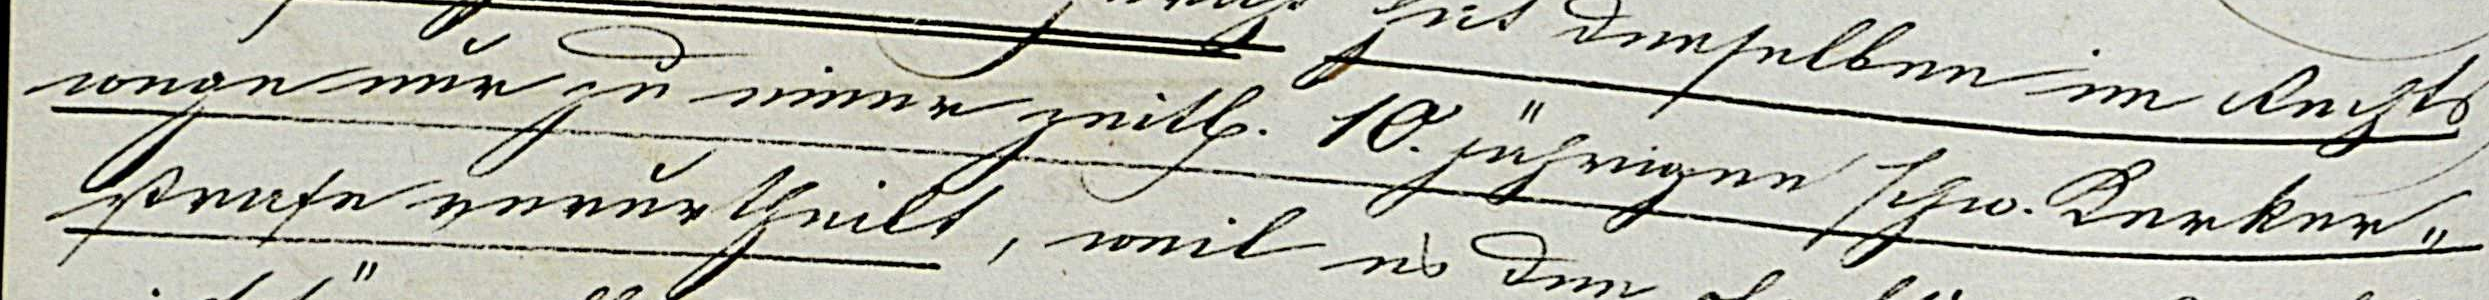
wege nur zu einer zeitl. 10jährigen schw. Kerker¬
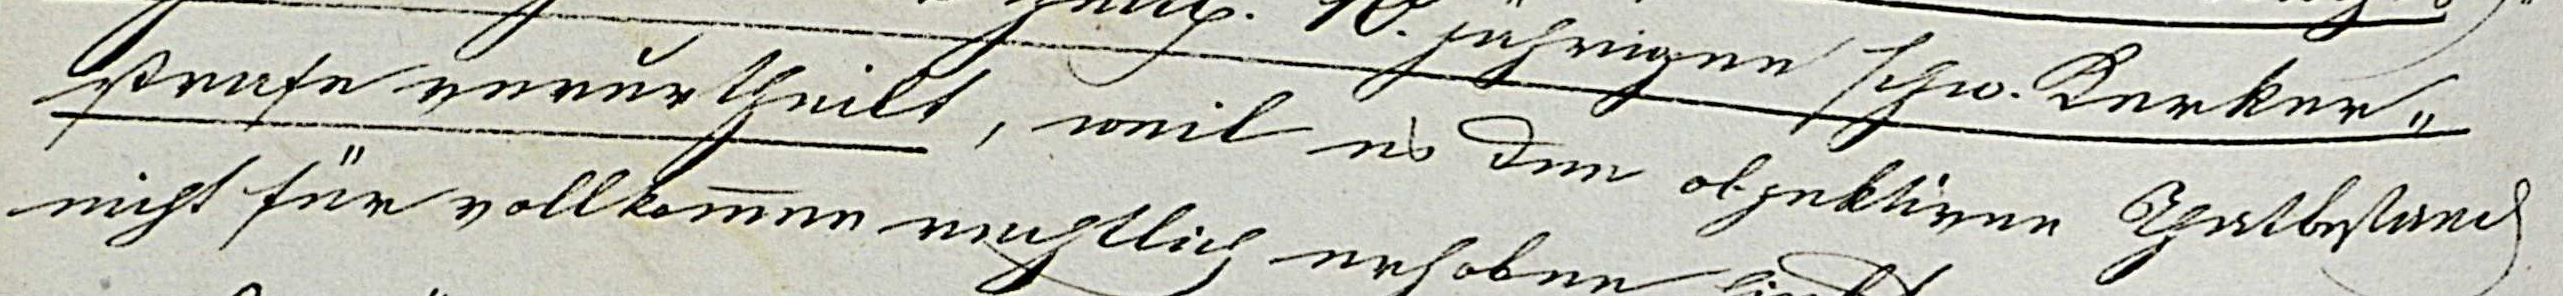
strafe verurtheilt, weil es den obzeckliren Thatbestand
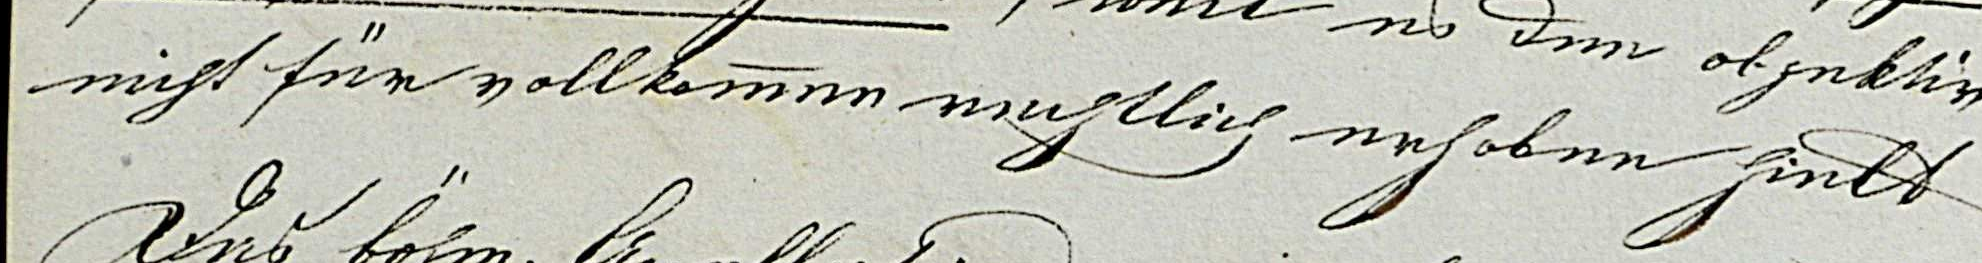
nicht für vollkommen rechtlich erhoben hielt.
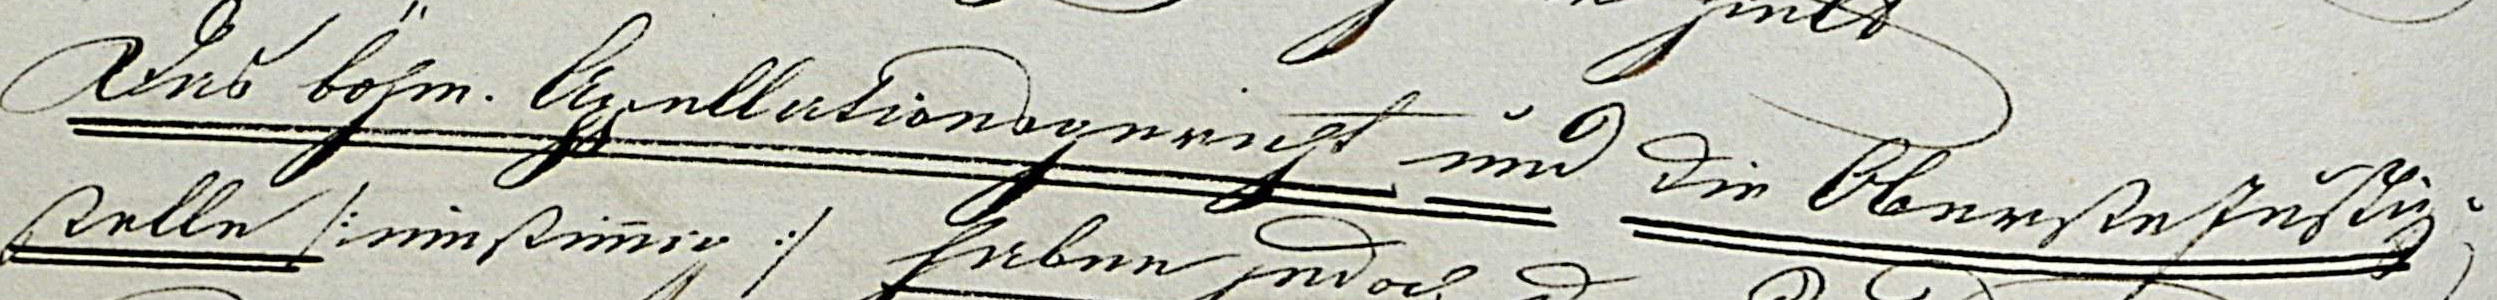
Das böhm. Appellationsgericht und die Oberste Justiz¬
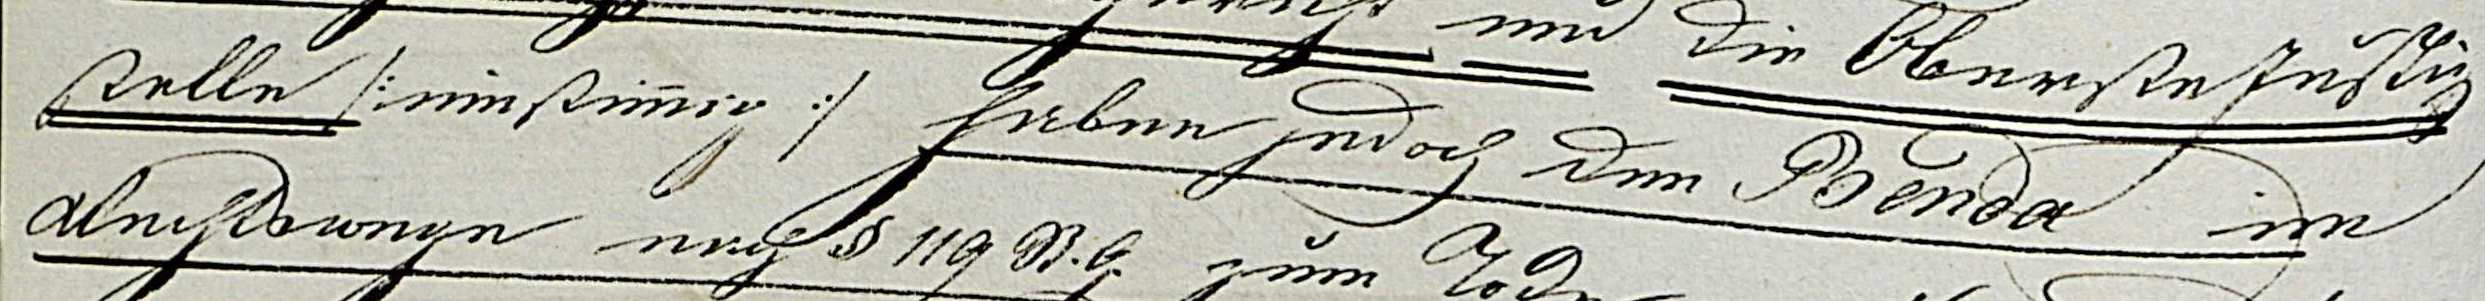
stelle (einstimmig) haben jedoch dem Benda in
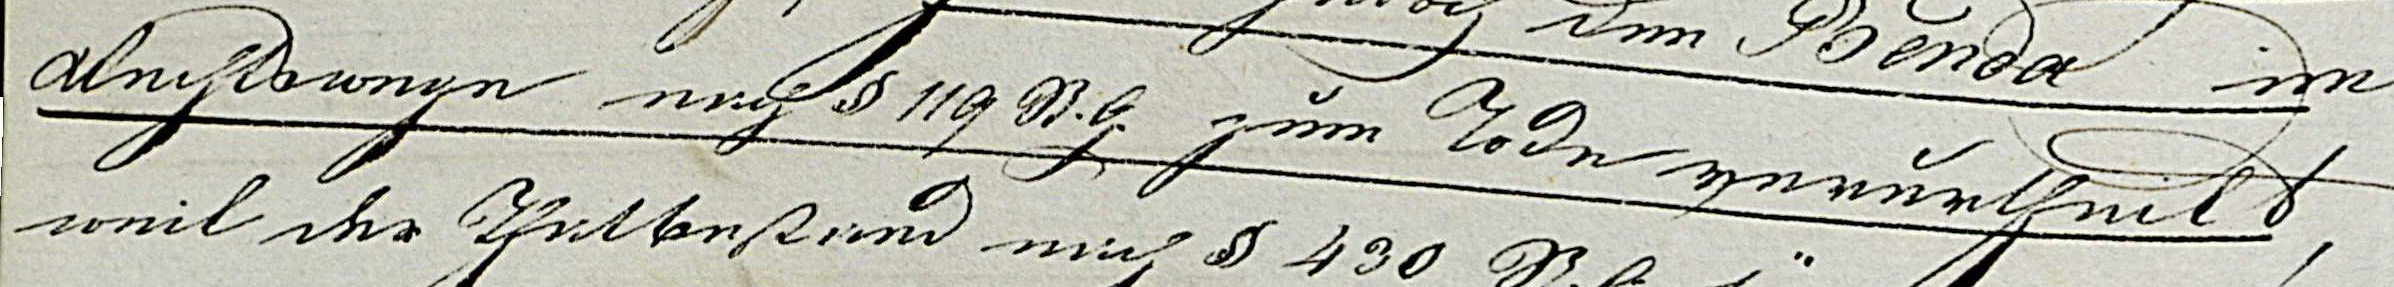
Rechtswege nach §119 St G zum Tode verurtheilt,
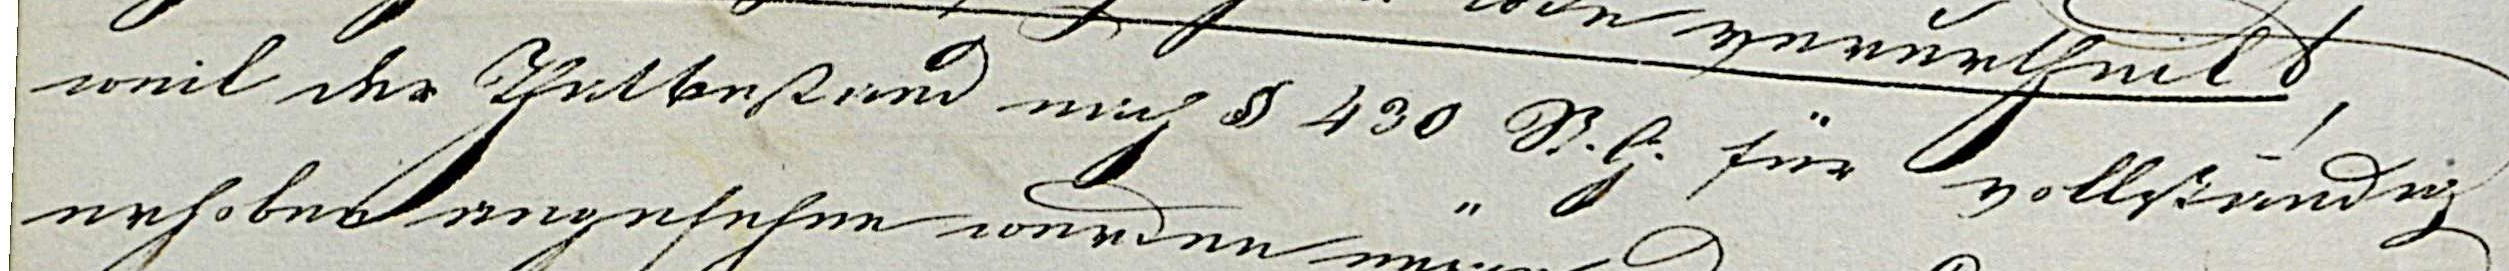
weil der Thatbestand nach §§430 StG für vollständig
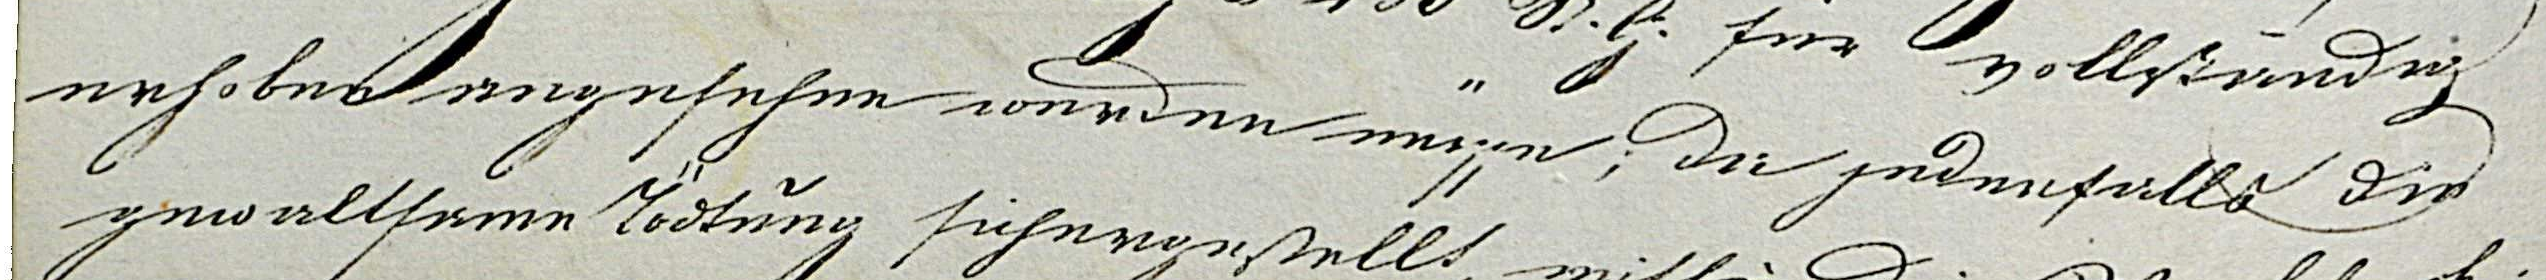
erhoben angesehen werden müsse; da jedenfalls die
